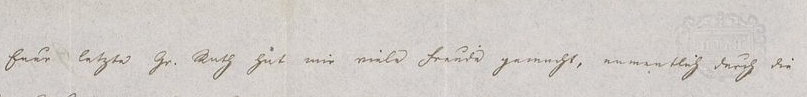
Euer letzte Gr. Rath hat mir viele Freude gemacht, namentlich durch die
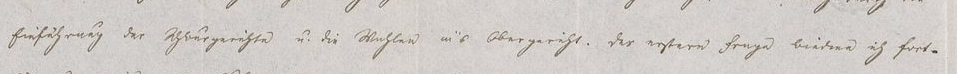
Einführung der Schwurgerichte u. die Wahlen in's Obergericht. Der erstern Frage wiedme ich fort-
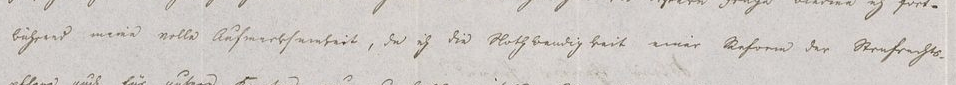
während meine volle Aufmerksamkeit, da ich die Nothwendigkeit einer Reform der Strafrechts-
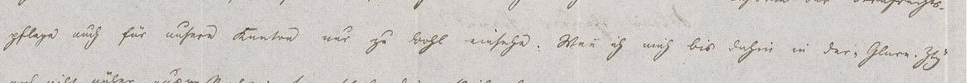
pflege auch für unsern Kanton nur zu wohl einsehe. Wenn ich mich bis dahin in der « Glarn. Ztg.»
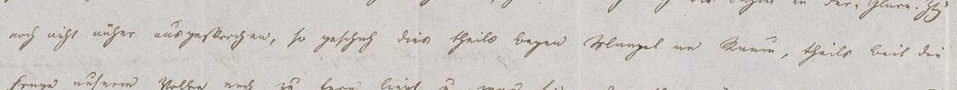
noch nicht näher ausgesprochen, so geschah dies theils wegen Mangel an Raum, theils weil die
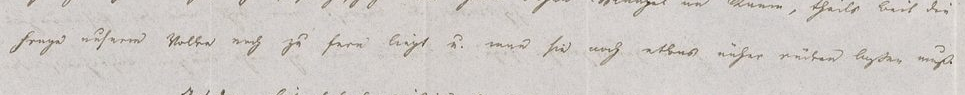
Frage unserm Volke noch zu fern liegt u. man sie noch etwas näher rücken lassen muß.
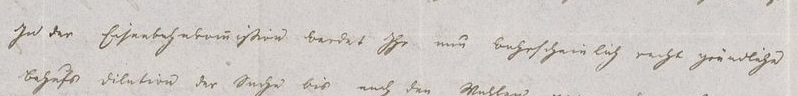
In der Eisenbahnkommission werdet Ihr nun wahrscheinlich recht gründliche
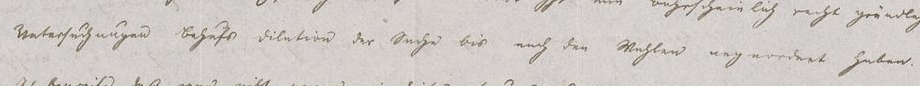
Untersuchungen behufs Dilation der Sache bis nach den Wahlen angeordnet haben.
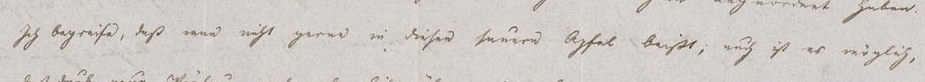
Ich begreife, daß man nicht gerne in diesen sauern Apfel beißt; auch ist es möglich,
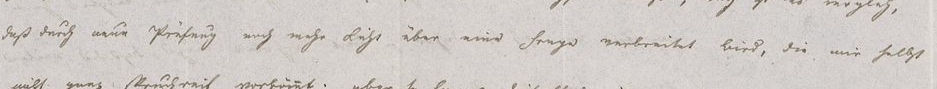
daß durch neue Prüfung noch mehr Licht über eine Frage verbreitet wird, die mir selbst
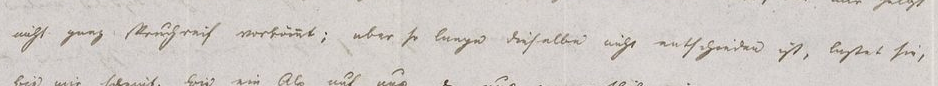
nicht ganz Spruchreif vorkömmt; aber so lange dieselbe nicht entschieden ist, lastet sie,
